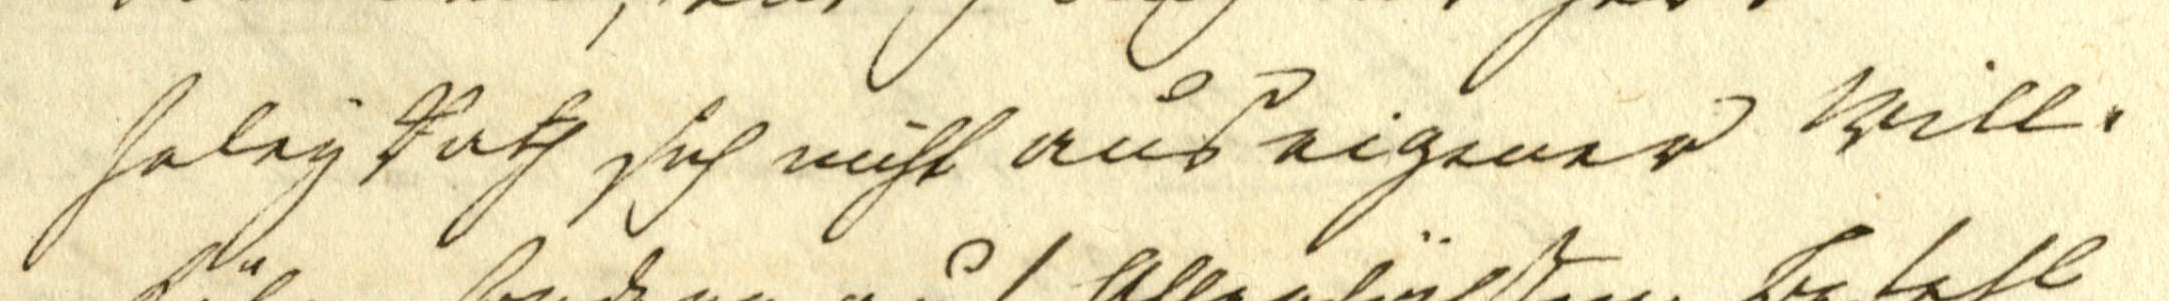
zeleÿ Rath sich nicht aus eigener Will¬
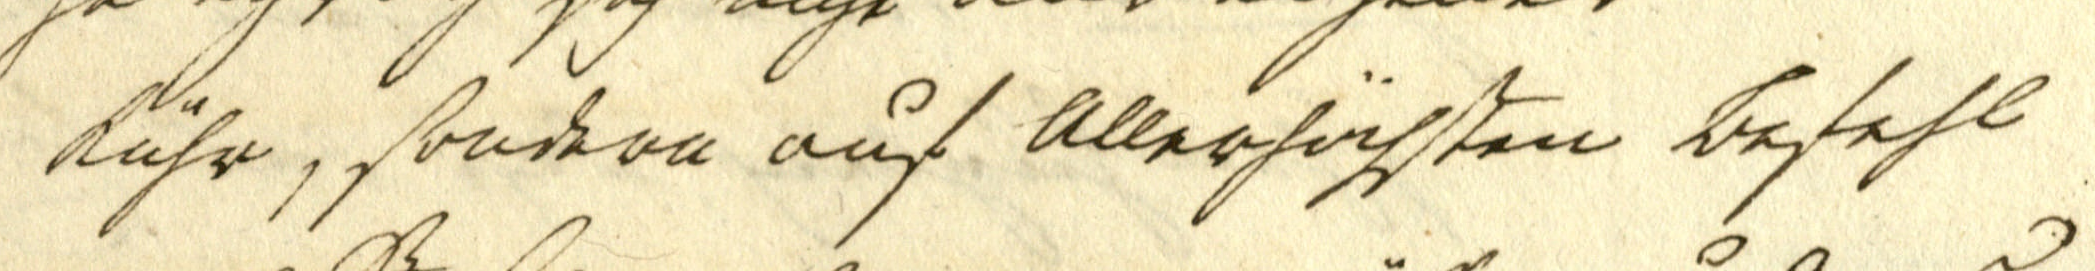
kühr, sondern auf Allerhöchsten Befehl
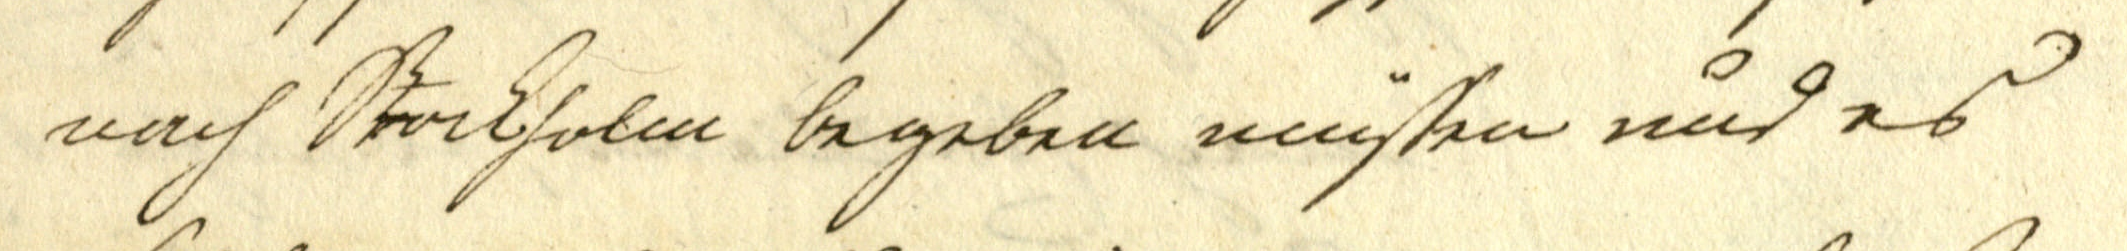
nach Stockholm begeben müssen und es
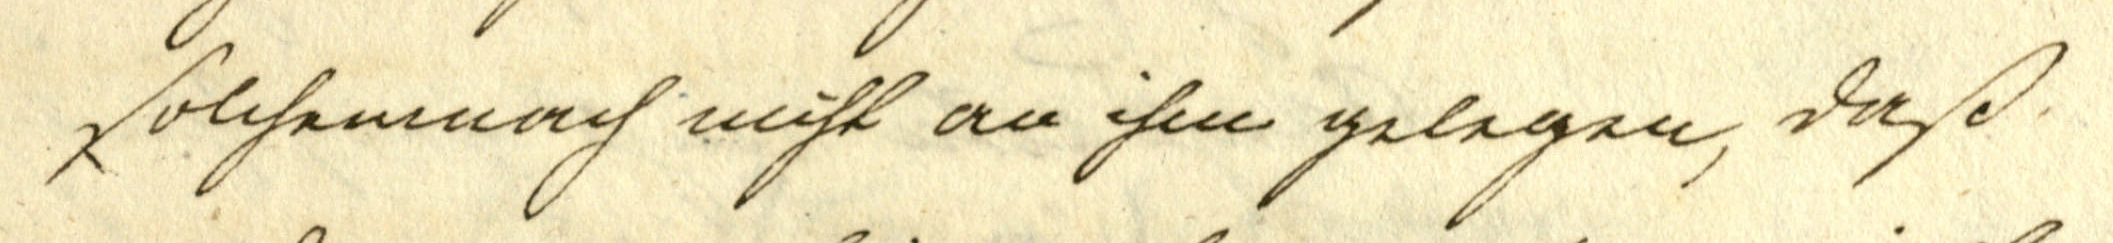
solchemnach nicht an ihm gelegen, daß
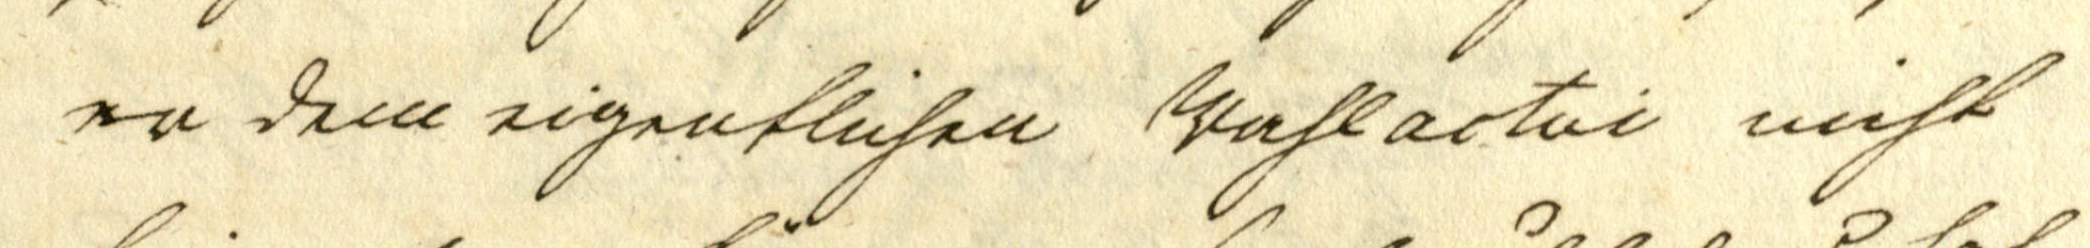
er dem eigentlichen Wahlactu nicht
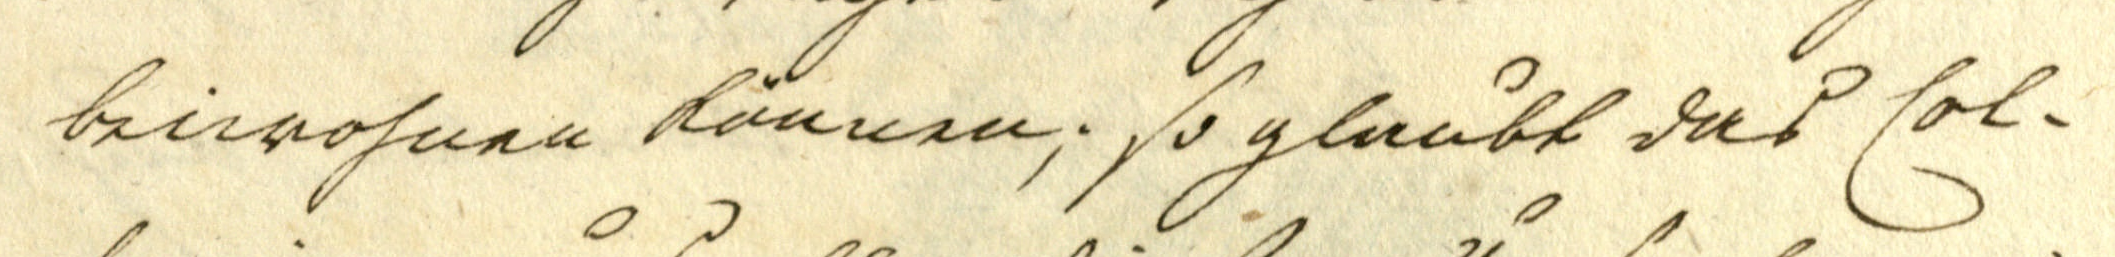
beiwohnen können, so glaubt das Col¬
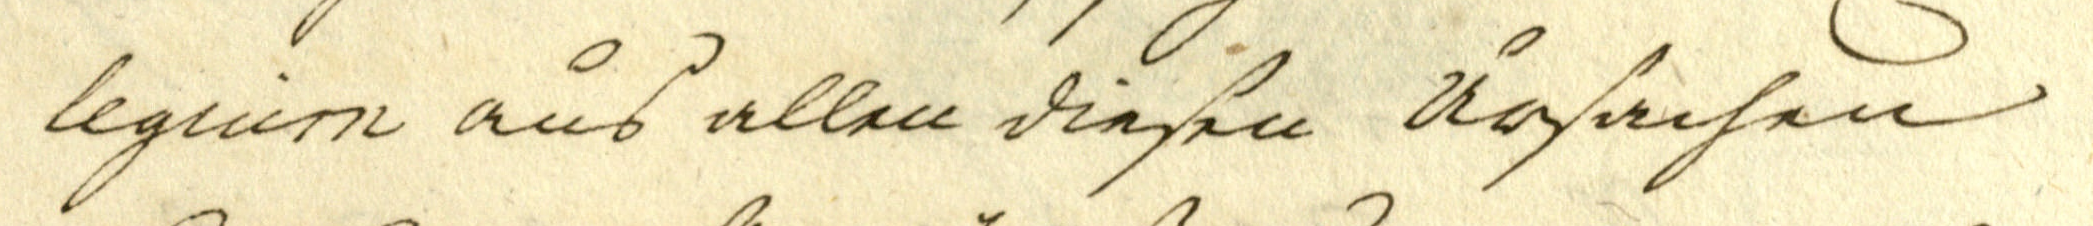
legium aus allen diesen Ursachen
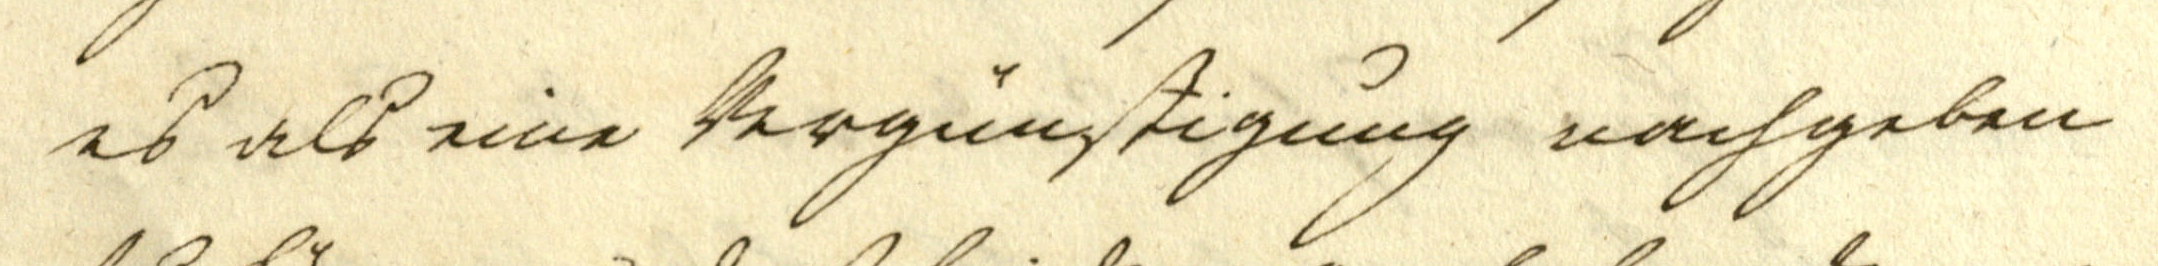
es als eine Vergünstigung nachgeben
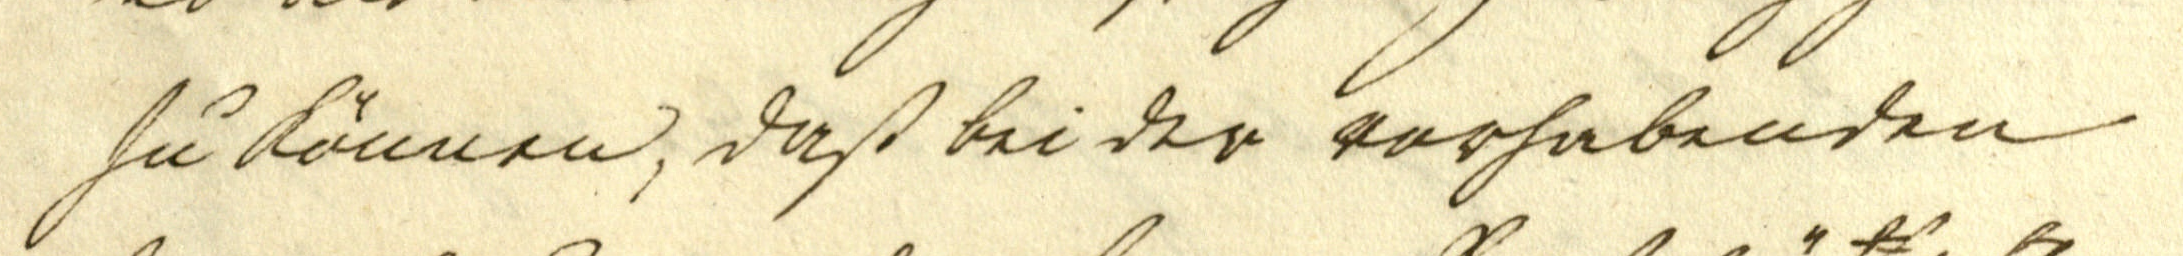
zu können, daß bei der vorhabenden
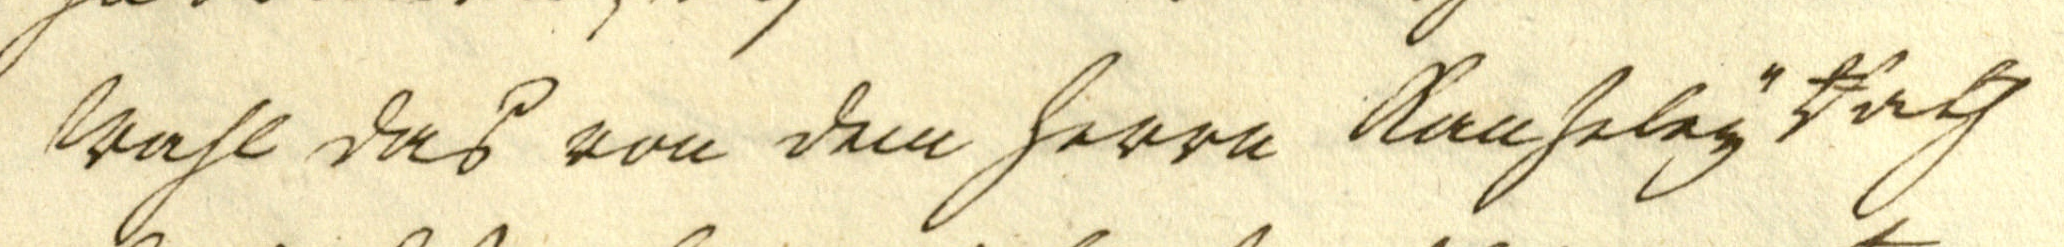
Wahl das von dem Herrn Kanzeleÿ Rath
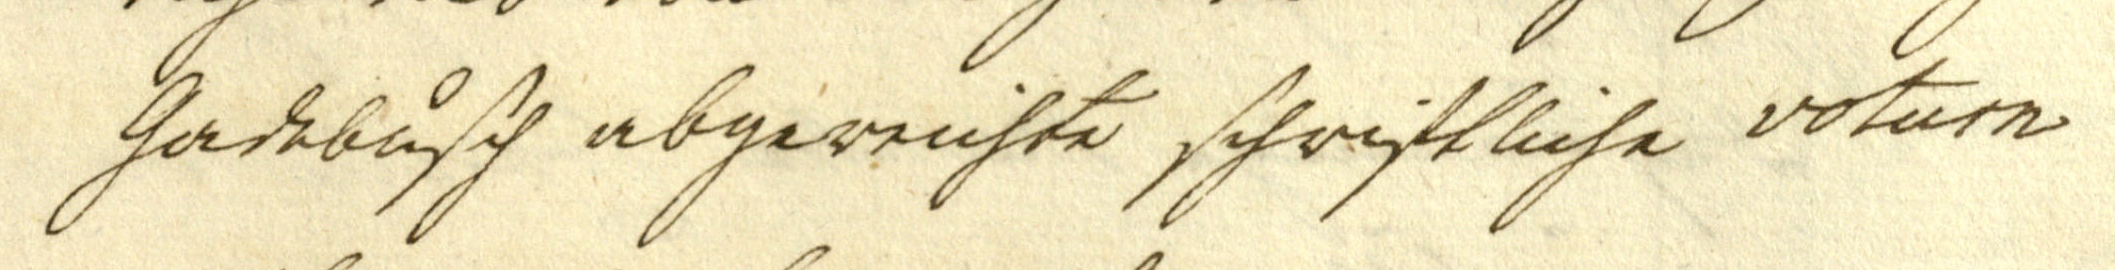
Gadebusch abgereichte schriftliche votum
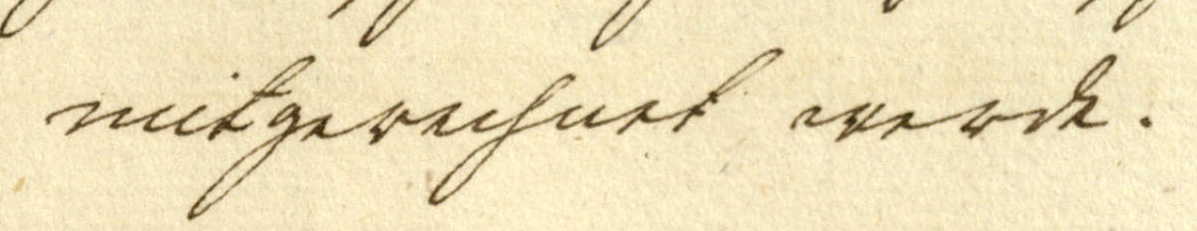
mitgerechnet werde.
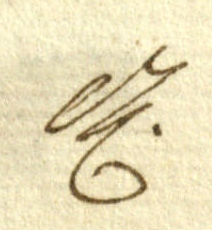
dh.
